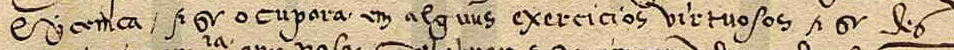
lycença / e se ocupara em alguūs exercicios virtuosos e se des
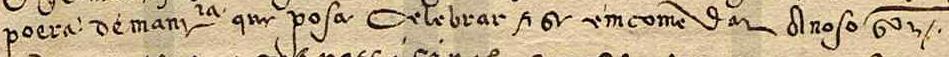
poera de manrra que posa Çelebrar e se emcomēdar A noso s̄or /.
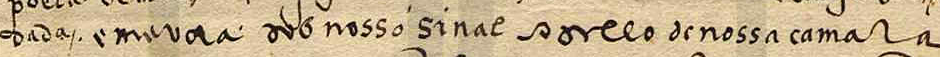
dada / em evora sob nosso sinal e sello de nossa camara
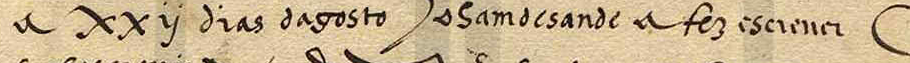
a xxij dias dagosto Joham de sande a fez escreuer e
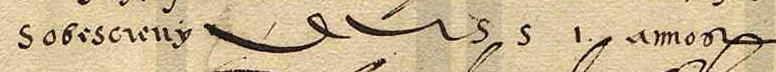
sobescreuy de i55i annos
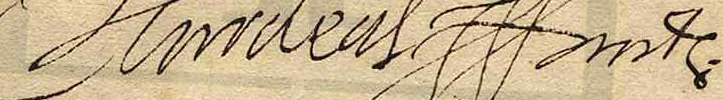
O Cardeal Jffante
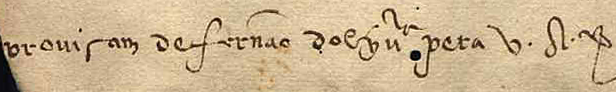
prouisam de fernão dolyura pera v. A. ꝟ
